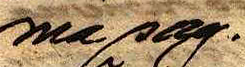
ma pag.
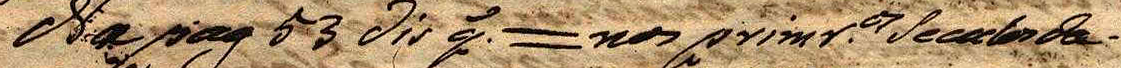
Na pag. 53 dis q̄. = nos primr.os seculos da
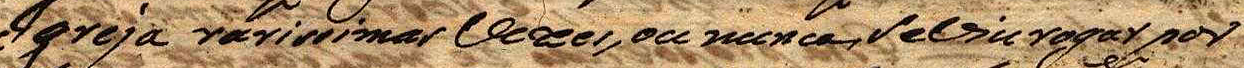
Igreja rarissimas Vezes, ou nunca se viu rogar por
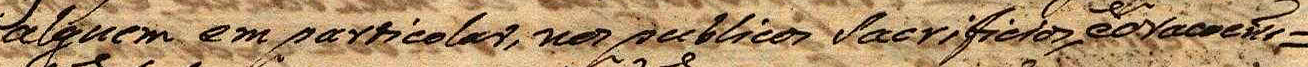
alguem em particolar, nos publicos sacrificios, e oracoeñs =
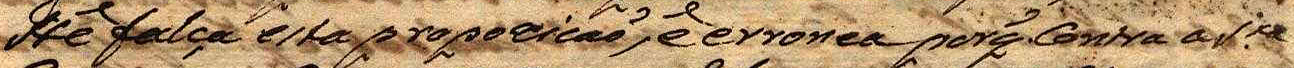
Hê falça esta prepozicaõ, ê erronea porq̄ contra a s.ta
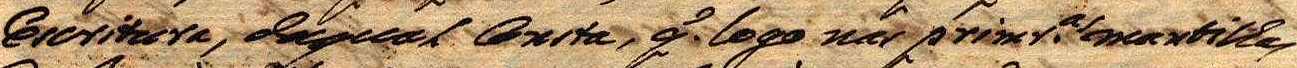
Escritura, da qual consta, q̄. Logo nas primr.as mantilhas
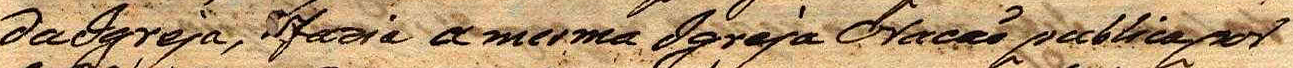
da Igreja, fazia a mesma Igreja oracaõ publica por
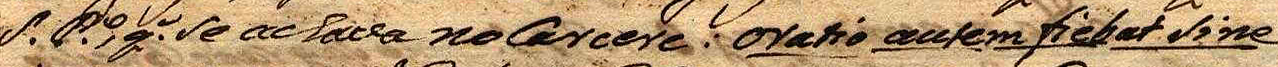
S. P.o, q̄. se achava no Carcere. oratio autem fiebat sine
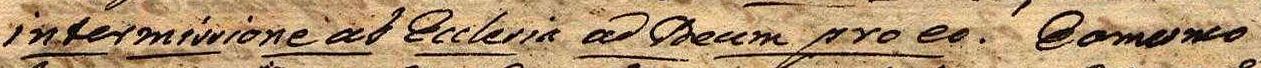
intermissione ad Ecclesia ad Deum pro eo. E o mesmo
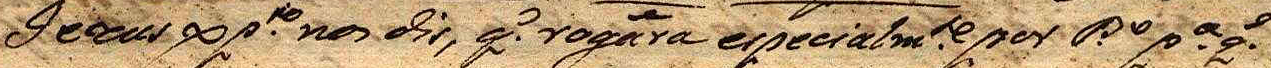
Iezus xp.to nos dis, q̄. rogâra especialm.te por P.o p.a q̄.o
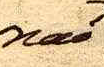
naõ
